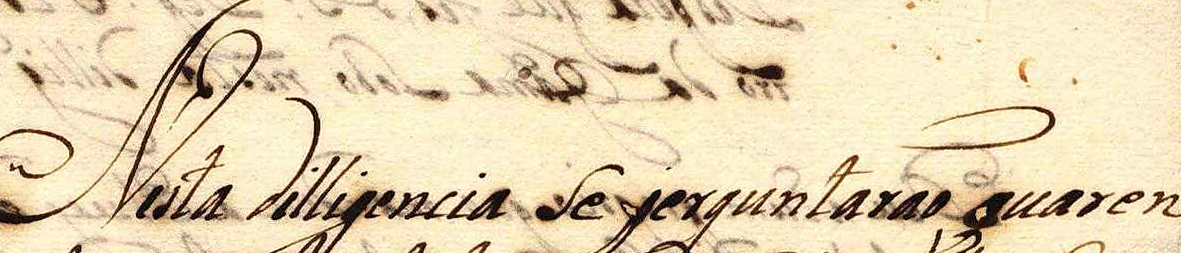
Nesta dilligencia se perguntarão quaren
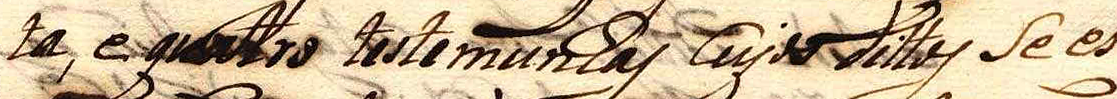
ta, e quatro testemunhas cujos dittos se es
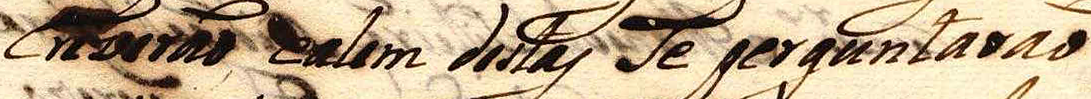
creverão, e alem destas se perguntaraõ
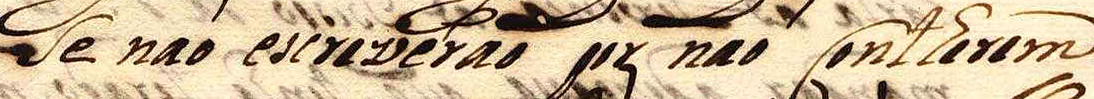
se naõ escreveraõ por naõ Contherem
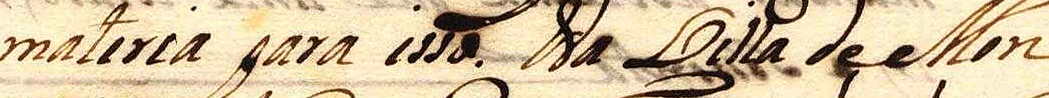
materia para isso. Na Villa de Mon
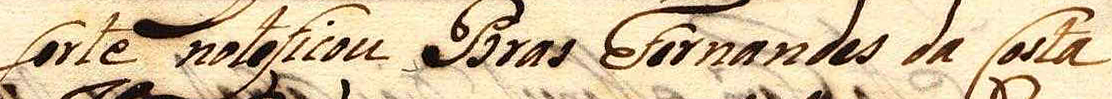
forte noteficou Bras Fernandes da Costa
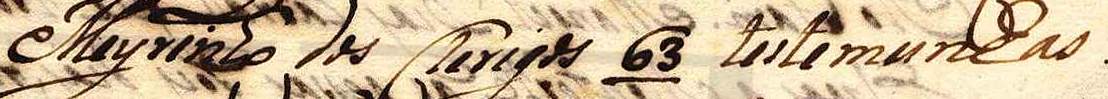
Meyrinho dos Clerigos 63 testemunhas.
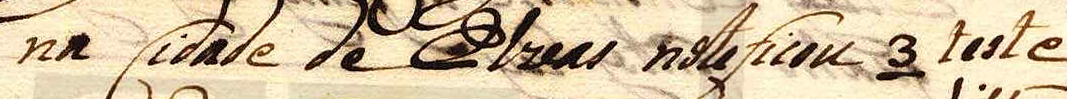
na Cidade de Elvas noteficou 3 teste
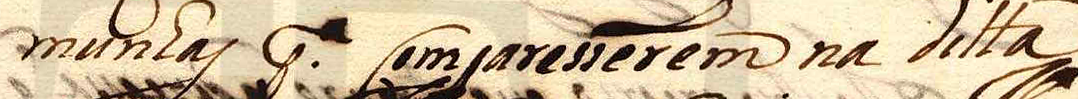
munhas p.a Comparesserem na ditta
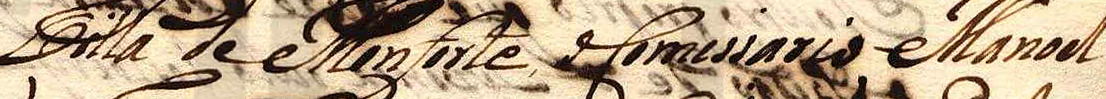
Villa de Monforte, o Comissario Manoel
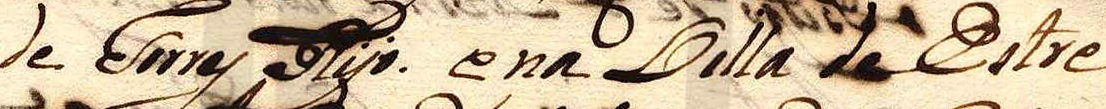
de Torres Rijo. e na Villa de Estre
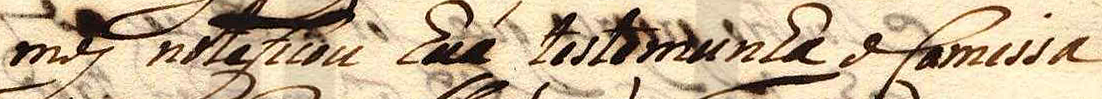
mos noteficou huā testemunha o Comissa
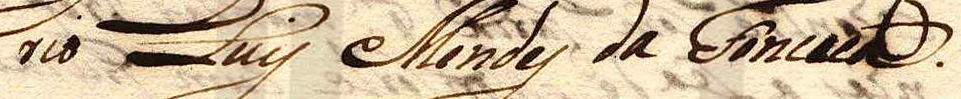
rio Luis Mendes da Fonceca.
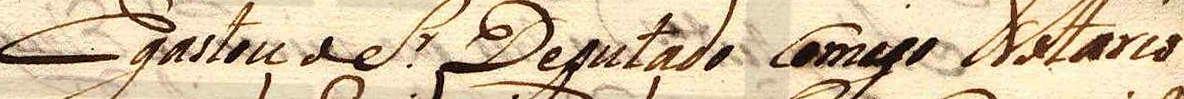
E gastou o S.r Deputados comigo Notario
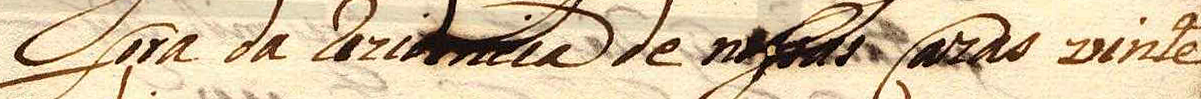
fora da Rezidencia de nossas Cazas vinte
